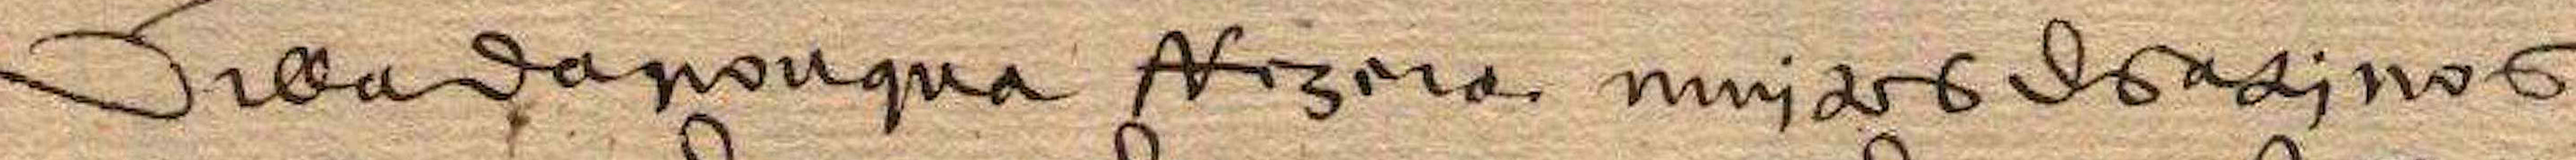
Villa darouqua ffezera muitos desatinos
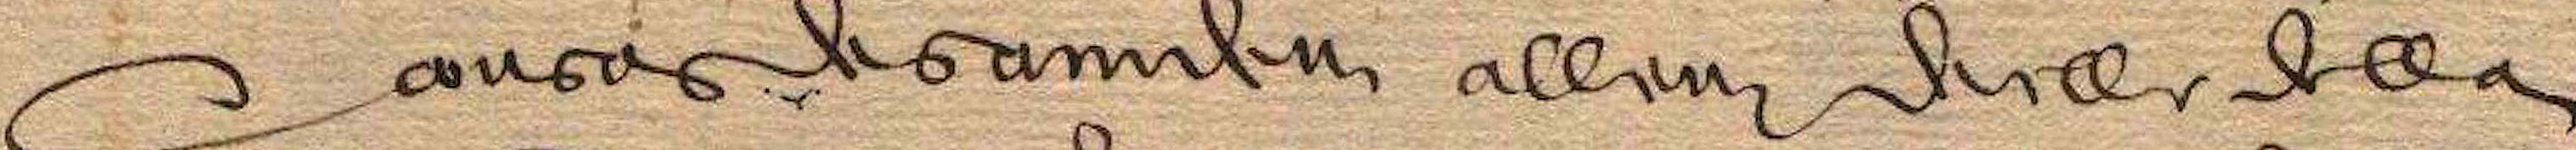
e cousas de samdeu allem de elle de lla
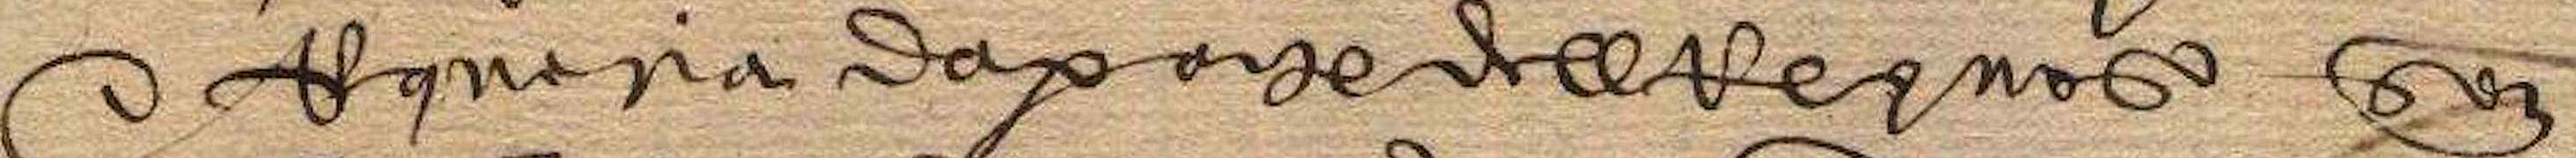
e Requeria da parte dell Rey noso s̄or
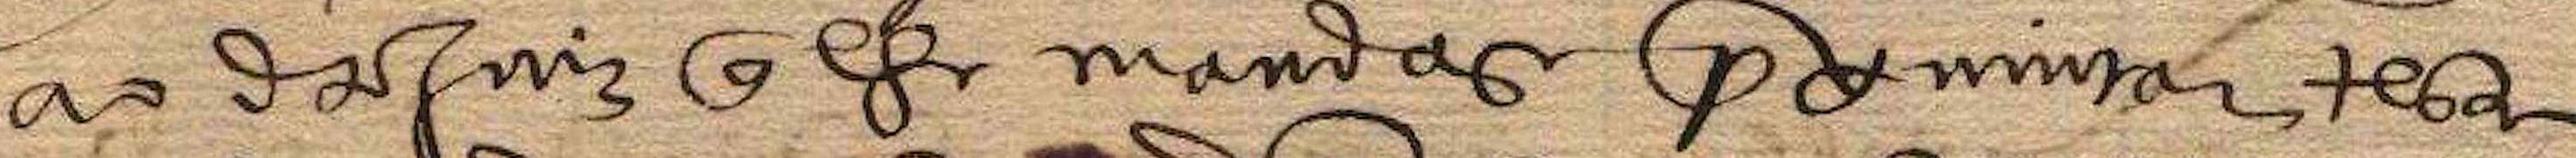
ao dto Juiz q̄ lhe mandase p̄gumtar teste
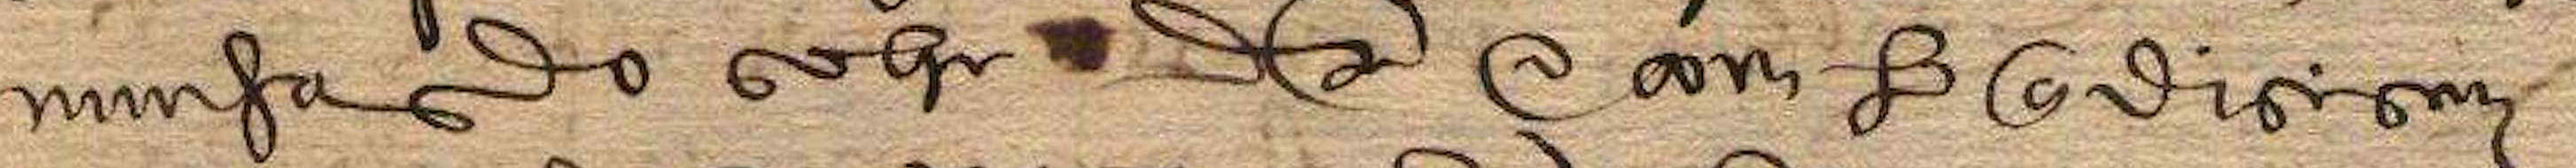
munhas do sobre dt̄o e com ho q̄ disesem
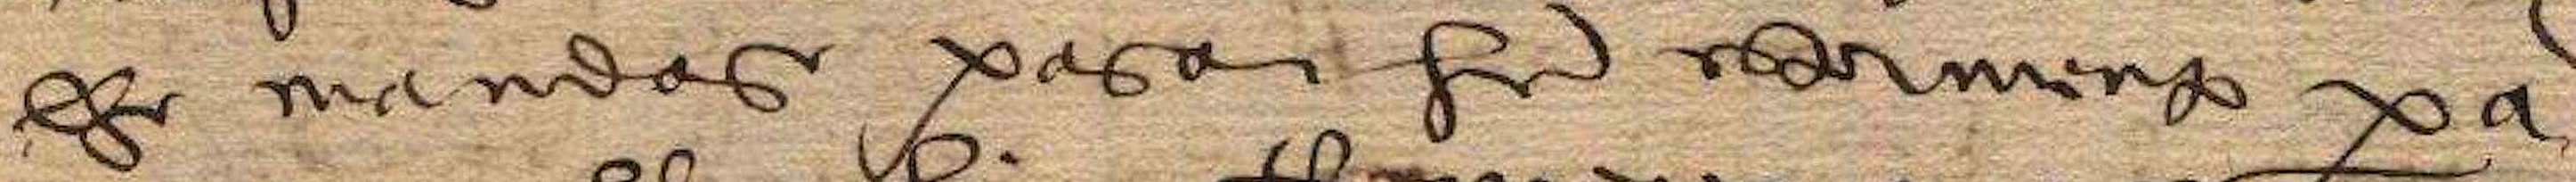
lhe mandase pasar hū estormento ꝑa
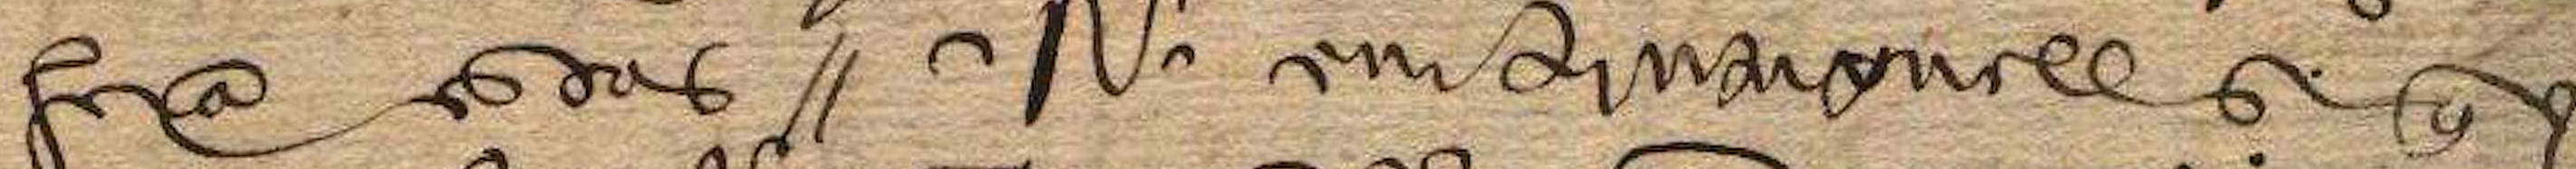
herā estas // -ss- em tintuguell se q̄y
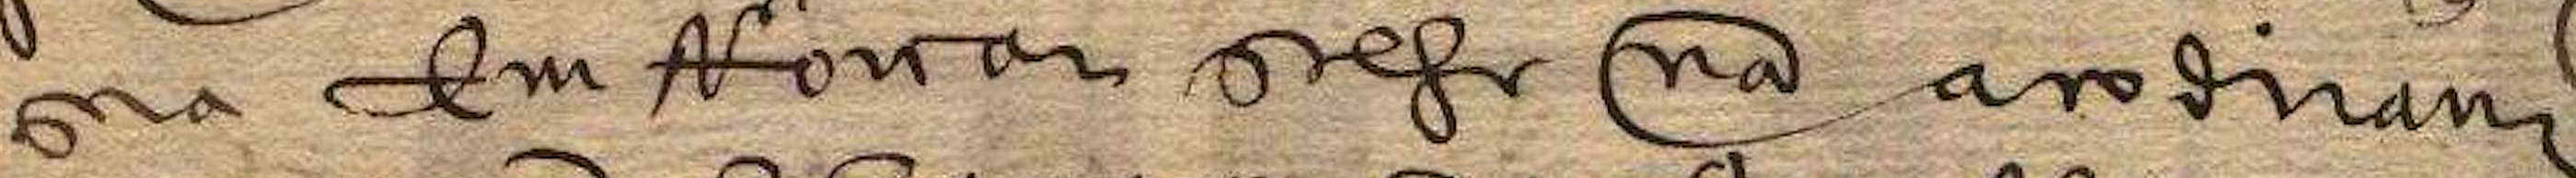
sera Emfforcar se lhe nā acodiram
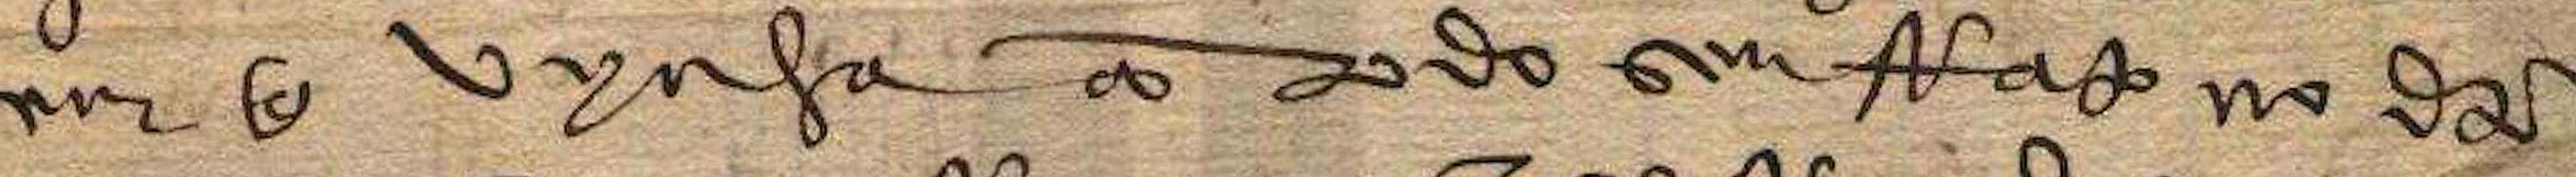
em que vynha c̄o todo seu ffato no dto
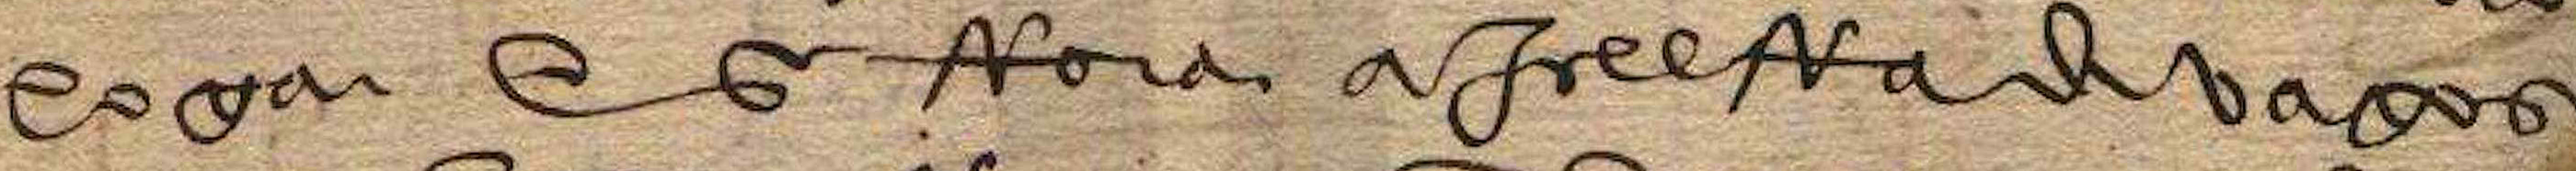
logar e se ffora a Jellffa de vagos
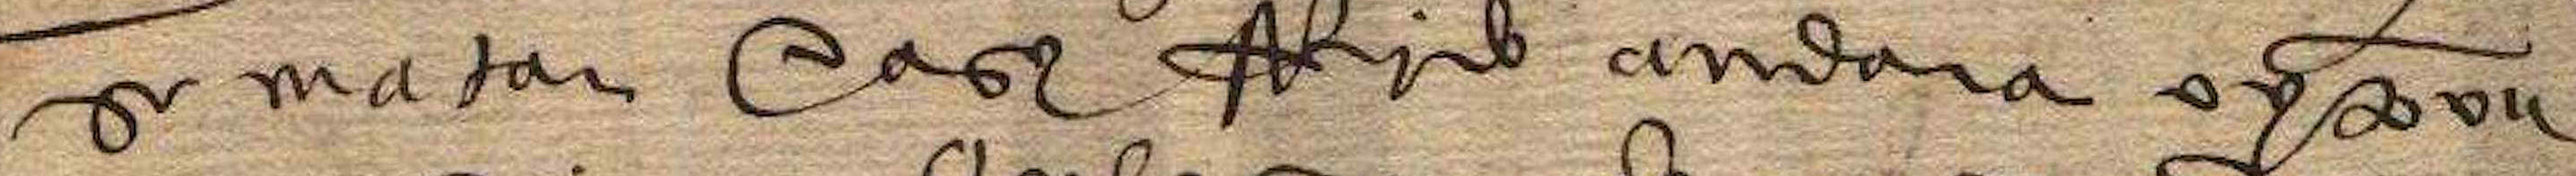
se matar e asy fferido andara oyto ou
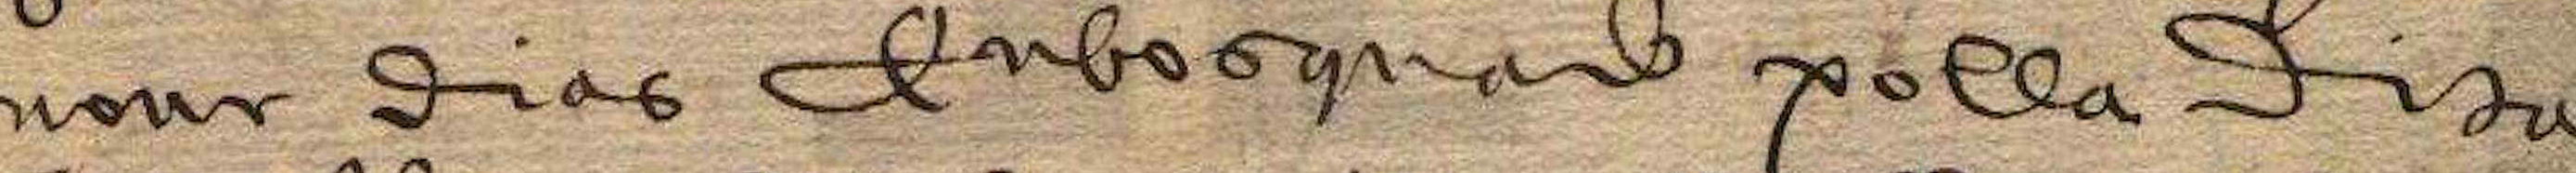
noue dias Enbosquado polla dita
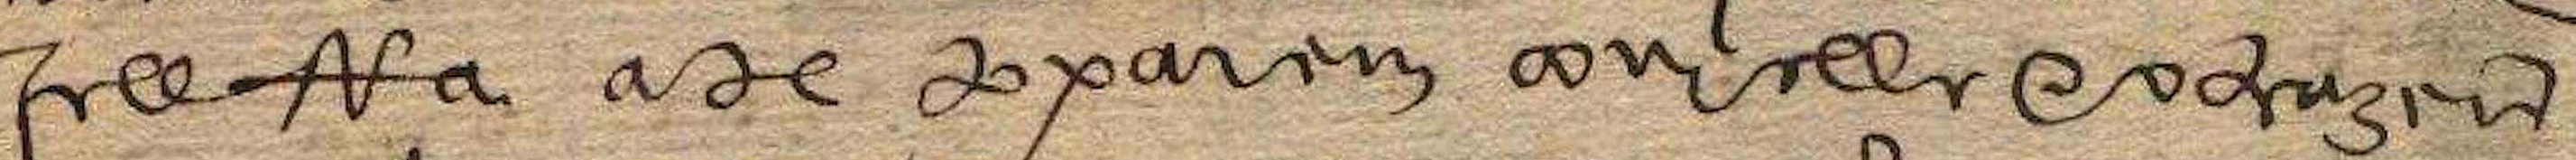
Jellffa ate toparem com elle e o trazerē
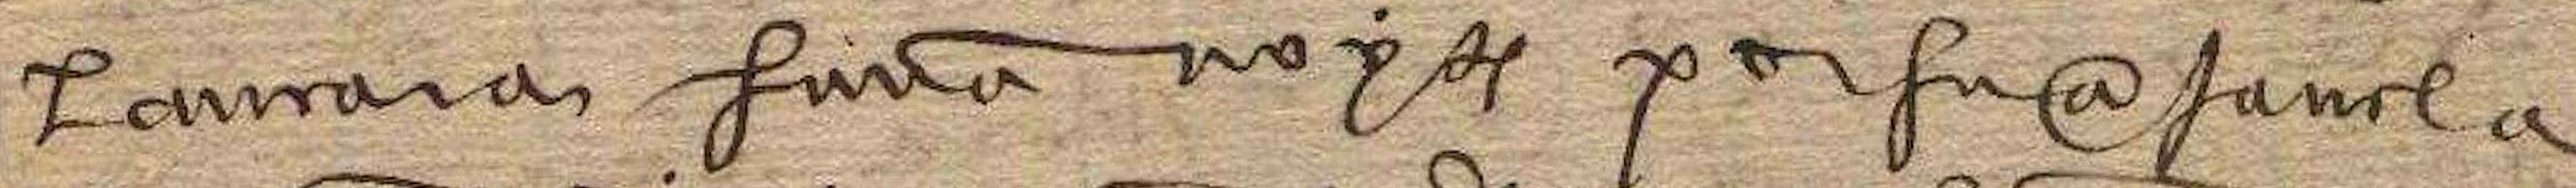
Lancara huūa noyte por huā Janela
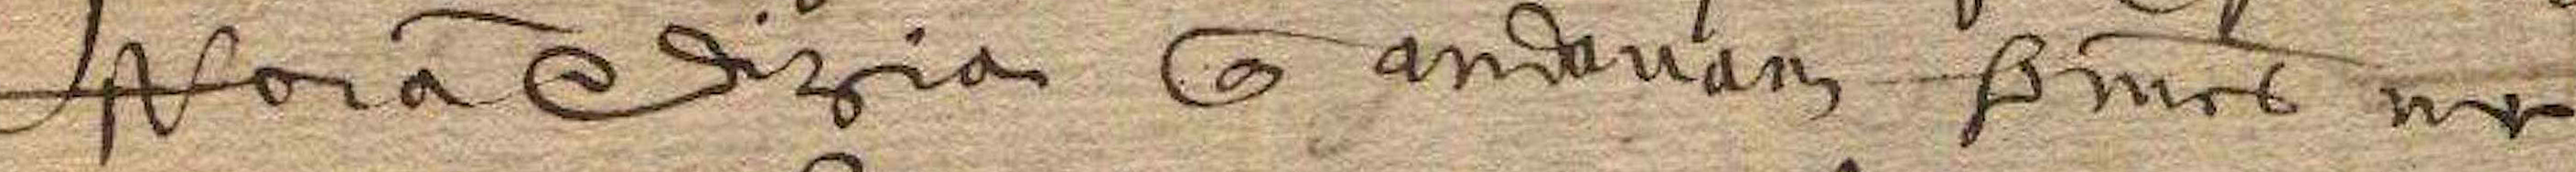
ffora e dizia que andauam hom̄es ne
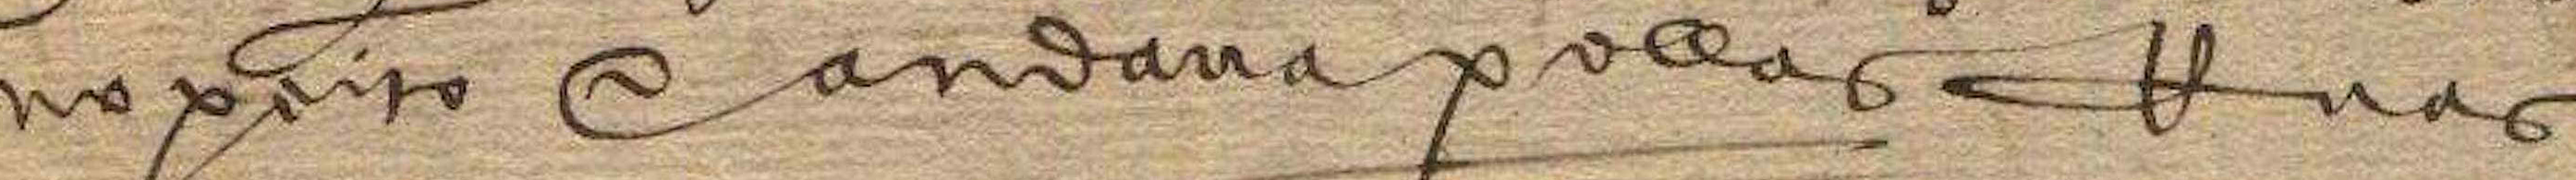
no peito e andaua pollas Ruas
